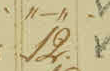12.
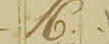16.
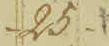25
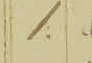1.
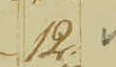12.
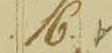16.
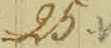25
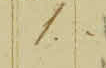1.
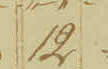12
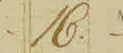16.
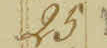25
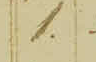1.
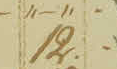12.
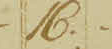16.
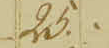25.
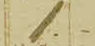1.
